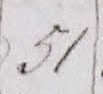51
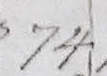74
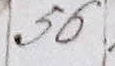56
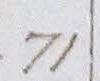71
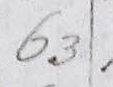63
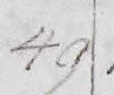49
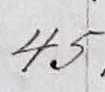45
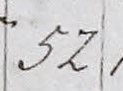52
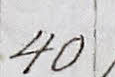40
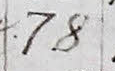78
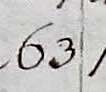63
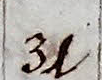31
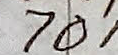70
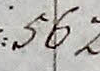56
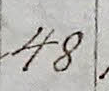48
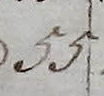55
